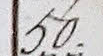50
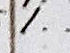1.
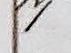7
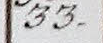33
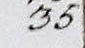35
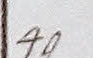49
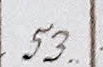53
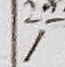1
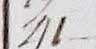41
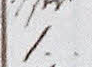1.
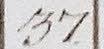37
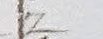2
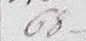68
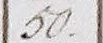50.
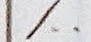1.
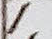1
